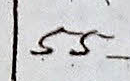55
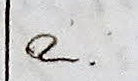2.
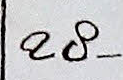28
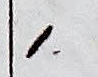1.
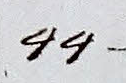44
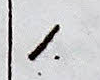1.
